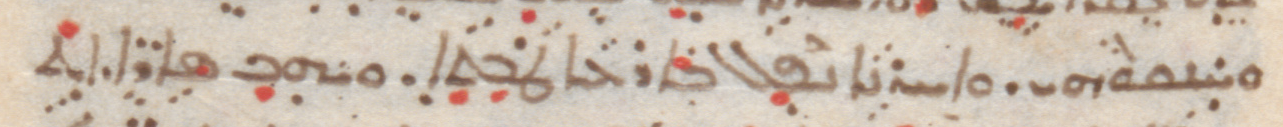ܘܚܢܩܘܗܝ. ܘܐܚܪܢܐ ܢܦ̣ܠ ܒܐܪܥܐ ܛܒܬܐ ܘܝܗ̣ܒ ܦܐܪ̈ܐ ܐܝܬ
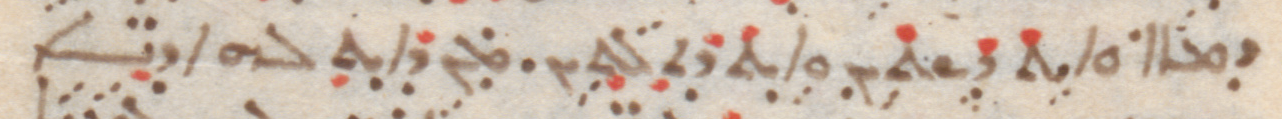ܕܡܐܐ ܘܐܝܬ ܕܫܬܝܢ ܘܐܝܬ ܕܬܠܬܝܢ. ܡ̇ܢ ܕܐܝܬ ܠܗ ܐܕܢ̈ܐ
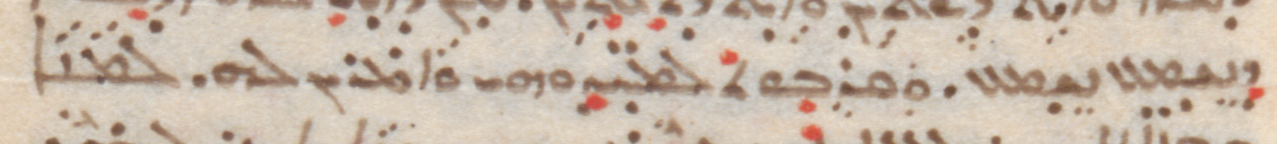ܕܢܫܡܥ ܢܫܡܥ. ܘܩܪܒܘ ܬܠܡܝ̈ܕܘܗܝ ܘܐܡܪܝܢ ܠܗ. ܠܡܢܐ
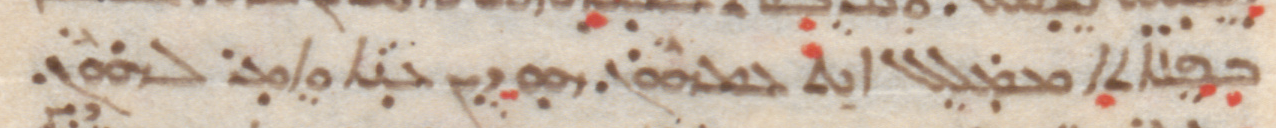ܒܦܠܐ̈ܬܐ ܡܡܠܠ ܐܢܬ ܥܡܗܘܢ. ܗ̣ܘ ܕܝܢ ܥܢ̣ܐ ܘܐܡ̣ܪ ܠܗܘܢ.
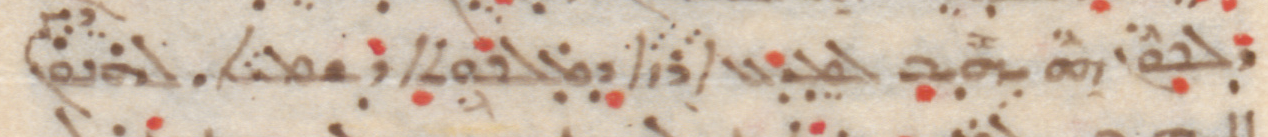ܕܠܟܘܢ ܗܘ ܝܗܝܒ ܠܡܕܥ ܐܪܙܐ ܕܡܠܟܘܬܐ ܕܫܡܝܐ. ܠܗܢܘܢ
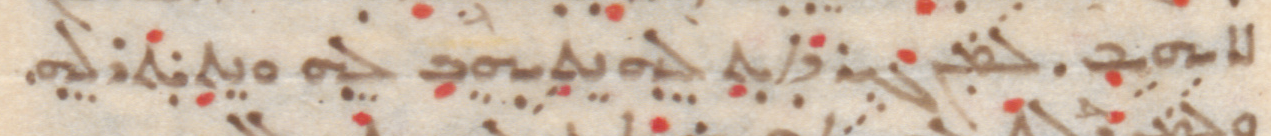ܠܐ ܝܗܝܒ. ܠܡܢ ܓܝܪ ܕܐܝܬ ܠܗ ܘܢܬܝܗܒ ܠܗ ܘܢܬܝܬܪ ܠܗ.
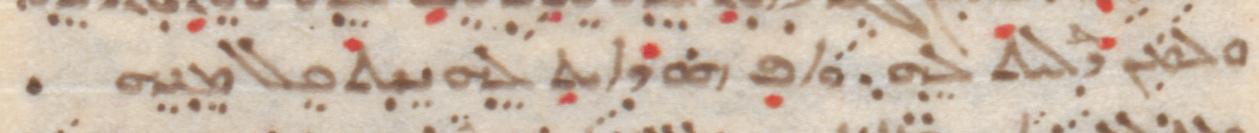ܘܠܡܢ ܕܠܝܬ ܠܗ. ܘܐܦ ܗ̇ܘ ܪܐܝܬ ܠܗ ܝܫܬܩܠ ܡܢܗ.
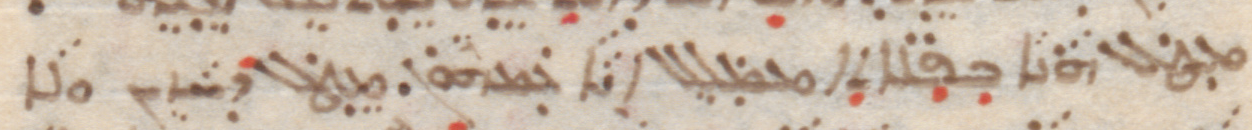ܡܛܠ ܗܢܐ ܒܦ̈ܠܐܬܐ ܡܡܠܠ ܐܝܐ ܥܡܗܘܢ. ܡܛܠ ܕܚܙܝܢ ܘܠܐ
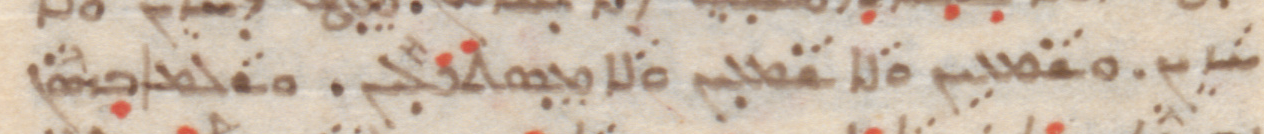ܚܙܝܢ. ܘܫ̇ܡܥܝܢ ܘܠܐ ܫܡܥܝܢ ܘܠܐ ܡܣܬܟܠܝܢ. ܘܫܠܡܐ ܒܗܘܢ
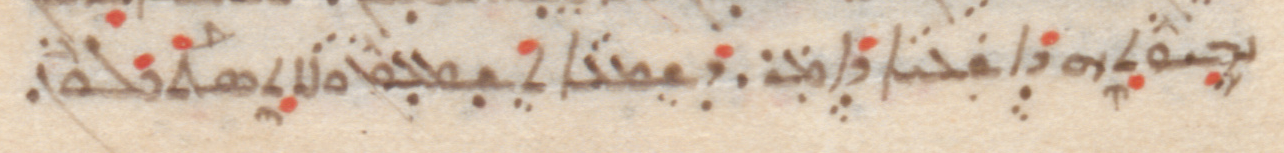ܢܒܝܘܬܗ ܕܐ ܫܥܝܐ ܕܐܡܪ. ܕܫܡܥܐ ܬܫܡܥܘܢ ܘܠܐ ܬܣܬܟܠܘܢ.
